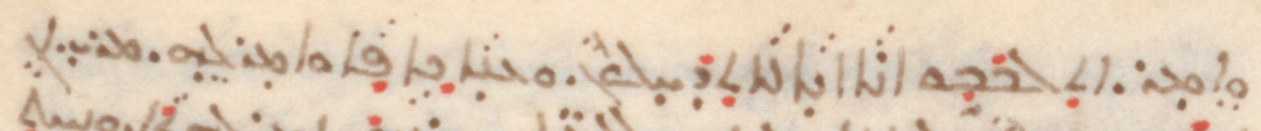ܘܐܡ̣ܪ. ܐܬܠܒܒܘ ܐܢܐ ܐܢܐ ܠܐ ܬܕܚܠܘܢ. ܘܥܢ̣ܐ ܟܐܦܐ ܘܐܡ̣ܪ ܠܗ. ܡܪܝ܆ ܐܢ
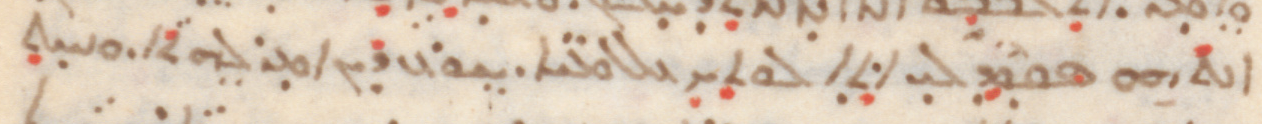ܐܢܬ ܗܘ ܦܩܘܕ ܠܝ ܐܬܐ ܠܘܬܟ ܥܠ ܡ̈ܝܐ. ܝܫܘܥ ܕܝܢ ܐܡ̣ܪ ܠܗ ܬܐ. ܘܢܚ̣ܬ
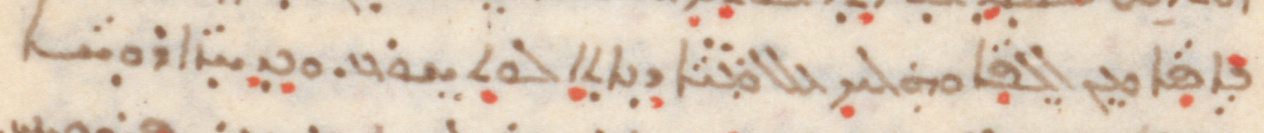ܟܐܦܐ ܡܢ ܐܠܦܐ ܘܗܠܟ ܥܠ ܡ̈ܝܐ ܕܢܐܬܐ ܠܘܬ ܝܫܘܥ. ܘܟܕ ܚܙܐ ܪܘܚܐ
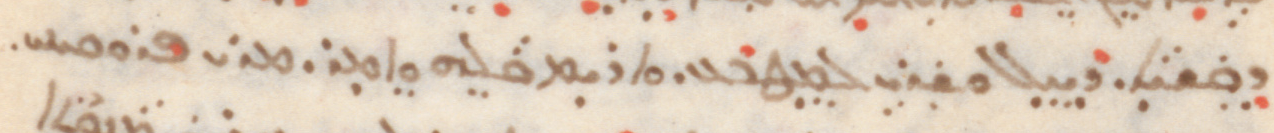ܕܩܫܝܐ. ܕܚ̣ܠ ܘܫܪܝ ܠܡܛܒܥ. ܘܐܪܝܡ ܩܠܗ ܘܐܡ̣ܪ. ܡܪܝ ܦܪܘܩܝܢܝ.
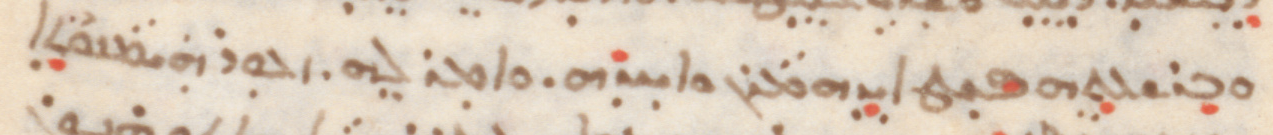ܘܒܪ ܫܥܬܗ ܦܫ̣ܛ ܐܝܕܗ ܡܪܢ ܕܐܚܕܗ. ܘܐܡ̣ܪ ܠܗ. ܙܥܘܪ ܗܝܡܢܘܬܐ
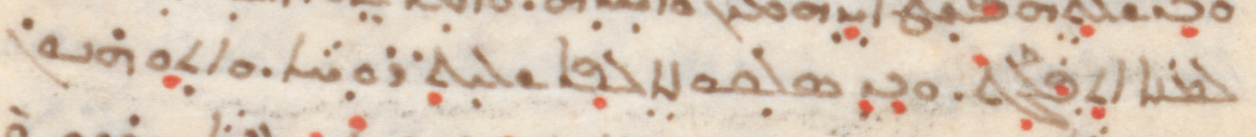ܠܡܢܐ ܐܬܦܠܓܬ. ܘܟܕ ܣܠܩܘ ܠܐܠܦܐ ܫܠܝܬ ܪܘܚܐ. ܘܐܬ̣ܘ ܗ̇ܢܘܢ
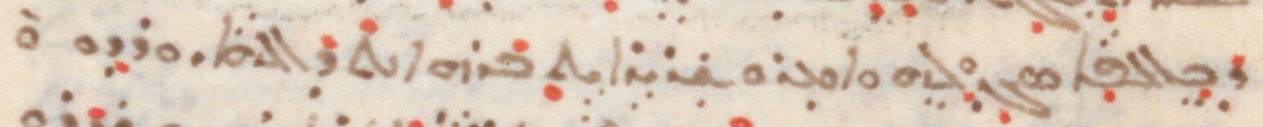ܕܒܐܠܦܐ ܣܓܕܘ ܠܗ ܘܐܡ̣ܪܘ ܫܪܝܪܐܝܬ ܒܪܗ ܐܢܬ ܕܐܠܗܐ. ܘܪܕܘ ܏ܘ
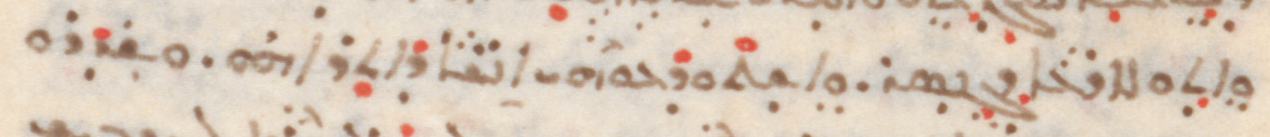ܘܐܬܘ ܠܐܪܥܐ ܕܓܢܣܪ. ܘܐܫܬܘܕܥܘܗܝ ܐܢܫ̈ܐ ܕܐܬܪܐ ܗ̇ܘ. ܘܫܕܪܘ
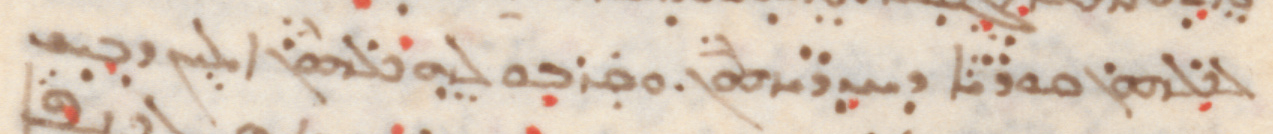ܠܟܠܗܘܢ ܩܘܪ̈ܝܐ ܕܚܕܪ̈ܝܗܘܢ. ܘܩܪܒܘ ܠܗ ܟܠܗܘܢ ܐܝܠܝܢ ܕܒܝܫ
